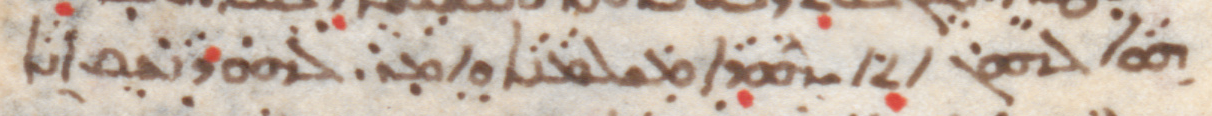ܗܘܐ ܠܗܘܢ ܐܬܐ ܝܗܘܕܐ ܡܫܠܡܢܐ ܘܐܡ̣ܪ. ܠܗܘ ܕܢ̇ܫܩ ܐܢܐ
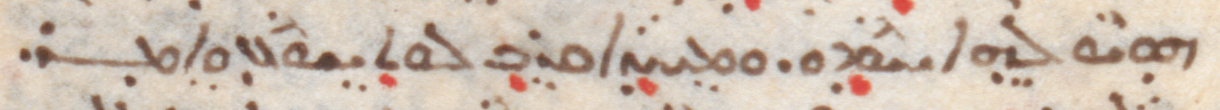ܗܘܝܘ ܠܗ ܐܚܘܕܘ. ܘܡܚܕܐ ܩܪܒ ܠܘܬ ܝܫܘܥ ܘܐܡ̣ܪ.
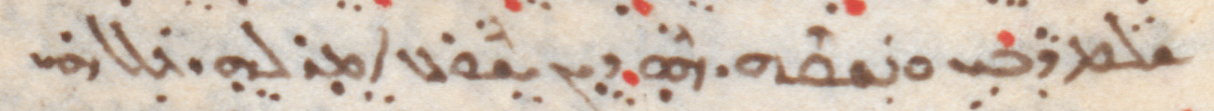ܫܠܡ ܪܒܝ ܘܢܫܩܗ. ܗ̣ܘ ܕܝܢ ܝܫܘܥ ܐܡ̣ܪ ܠܗ. ܥܠ ܗ̇ܝ
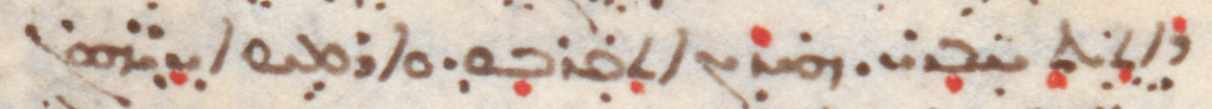ܐܬܝܬ ܚܒܪܝ. ܗܝܕܝܢ ܐܬܩܪܒܘ. ܘܐܪܡܝܘ ܐܝܕܝ̈ܗܘܢ
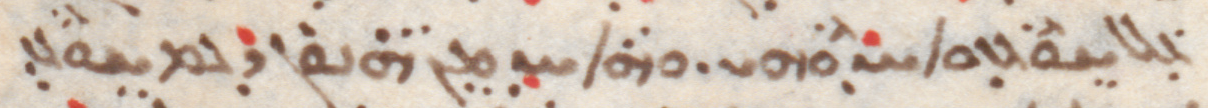ܥܠ ܝܫܘܥ ܘܐܚܕܘܗܝ. ܘܗܐ ܚܕ ܡܢ ܗܢܘܢ ܕܥܡ ܝܫܘܥ
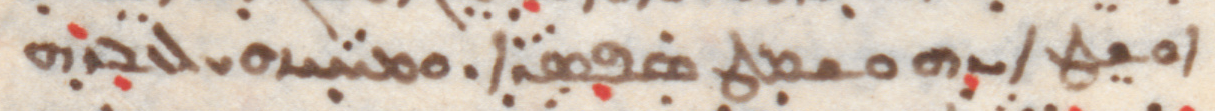ܐܘܫܛ ܐܝܕܗ ܘܫܡܛ ܣܦܣܪܐ. ܘܡܚܝܗܝ ܠܥܒܕܗ
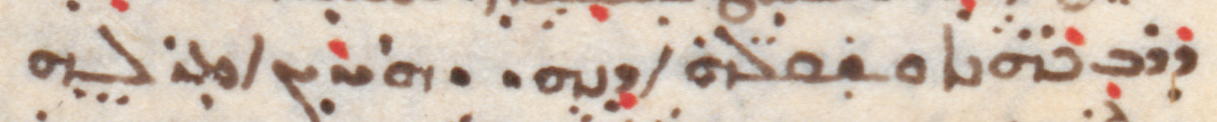ܕܪܒ ܟܗ̈ܢܐ ܘܫܩܠܗ̇ ܐܕܢܗ.. ܗܝܕܝܢ ܐܡ̣ܪ ܠܗ
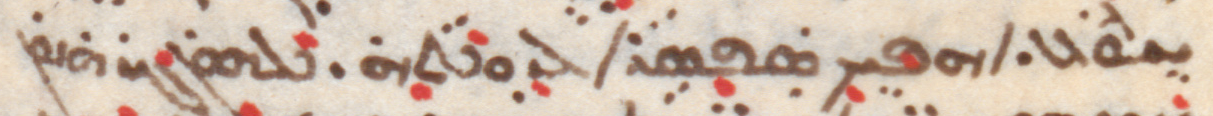ܝܫܘܥ. ܐܗܦܟ ܣܦܣܪܐ ܠܕܘܟܬܗ̇. ܟܠܗܘܓܝܪ ܗܢܘܢ
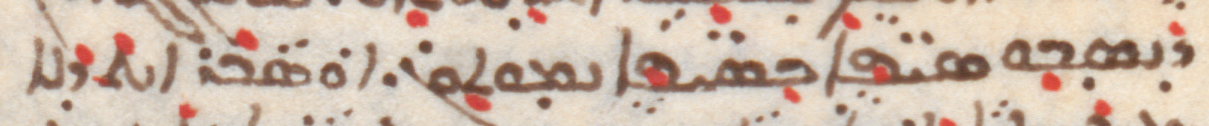ܕܢܣܒܘ ܣܝ̈ܦܐ ܒܣܝ̈ܦܐ ܢܡܘܬܘܢ. ܐܘ ܣܒܪ ܐܢܬ ܕܠܐ
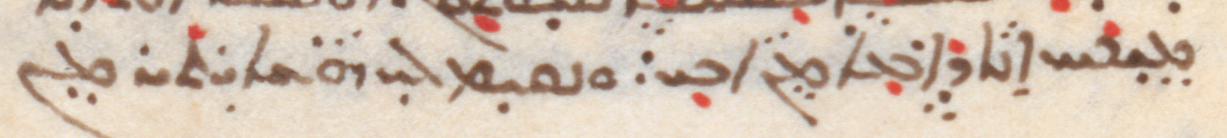ܡܫܟܚ ܐܢܐ ܕܐܒܥܐ ܡܢ ܐܒܝ: ܘܢܩܝܡ ܠܝ ܗܫܐ ܝܬܝܪ ܡܢ
